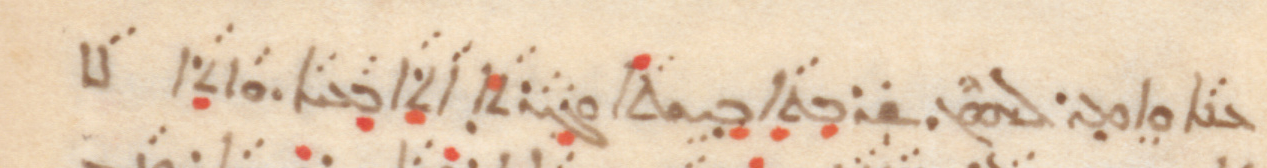ܥܢܐ ܘܐܡ̣ܪ ܠܗܘܢ. ܫܪܒܬܐ ܒܝܫܬܐ ܘܓܝܪܬܐ ܐܬܐ ܒܥܝܐ. ܘܐܬܐ ܠܐ
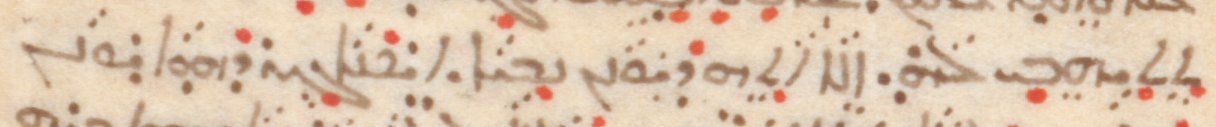ܬܬܝܗܒܝ ܠܗ̇. ܐܠܐ ܐܬܗ ܕܝܘܢܢ ܢܒܝܐ. ܐܝܟܢܐ ܓܝܪ ܕܗܘܐ ܝܘܢܢ
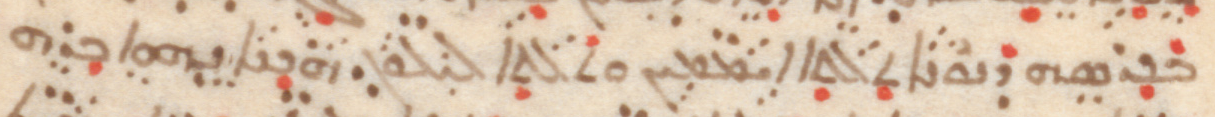ܒܟܪܣܗ ܕܢܘܢܐ ܬܠܬܐ ܐܝܡ̈ܡܝܢ ܘܬܠܬܐ ܠܝ̈ܠܘܢ: ܗܟܢܐ ܢܗܘܐ ܒܪܗ
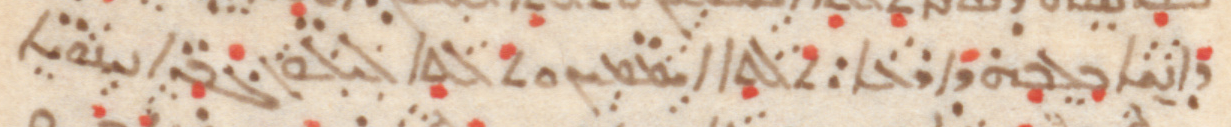ܕܐܢܫܐ ܒܠܒܗ̇ ܕܐܪܥܐ܇ ܬܠܬܐ ܐܝܡ̈ܡܝܢ ܘܬܠܬܐ ܠܝܠܘ̈ܢ. ܓܒܪ̈ܐ ܢܝܢܘ̈ܝܐ
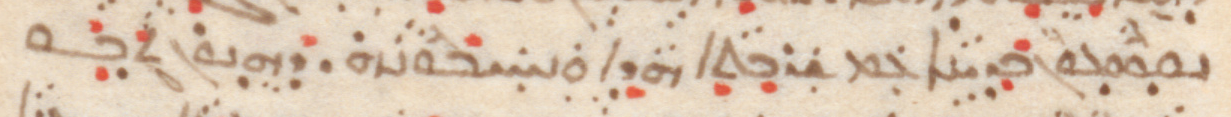ܢܩܘܡܘܢ ܒܕܝܢܐ ܥܡ ܫܪܒܬܐ ܗܕܐ ܘܢܚܝܒܘܢܗ̇ ܕܗܢܘܢ ܬܒܘ
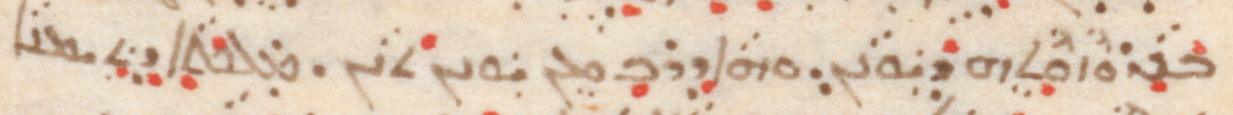ܒܟܪܘܙܘܬܗ ܕܝܘܢܢ܆ ܘܗܐ ܕܪܒ ܡܢ ܝܘܢܢ ܬܢܢ. ܡܠܟܬܐ ܕܬܝܡܢܐ
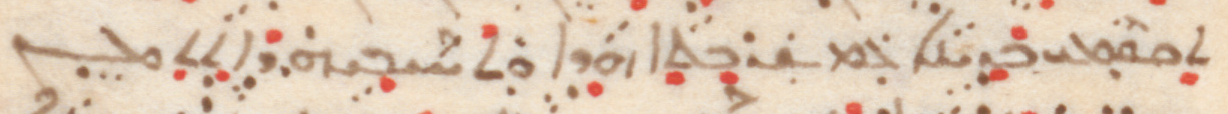ܬܩܘܡܝ ܒܕܝܢܐ ܥܡ ܫܪܒܬܐ ܗܕܐ ܘܬܚܝܒܝܗ̇ ܕܐܬ̣ܬ ܡ̣ܢ
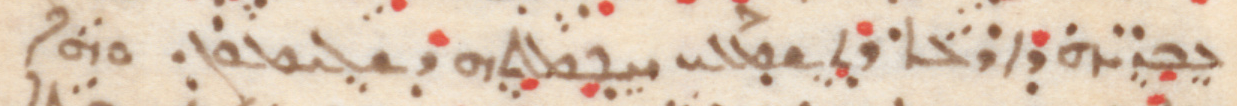ܥܒܪ̈ܝܗ̇ ܕܐܪܥܐ ܕܬܫܡ̣ܥܝ ܚܟܡܬܗ ܕܫܠܝܡܘܢ܆ ܘܗܐ
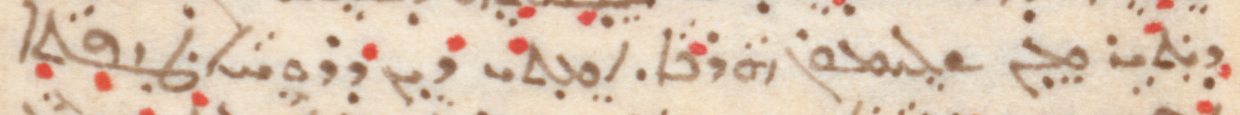ܕܝܬܝܪ ܡ̣ܢ ܫܠܝܡܘܢ ܗܪܟܐ. ܐܡܬܝ ܕܝܢ ܕܪܘܚܐ ܛܢܦܬܐ
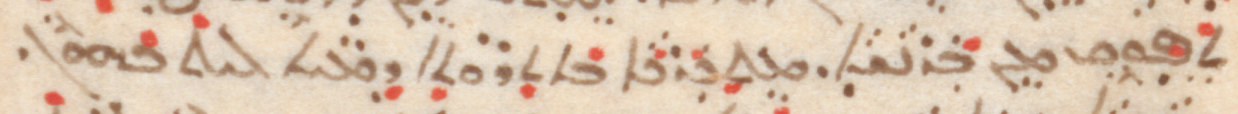ܬܦܘܩ ܡܢ ܒܪܢܫܐ. ܡܬܟܪܟܐ ܒܐܬܪ̈ܘܬܐ ܕܡ̈ܝܐ ܠܝܬ ܒܗܘܢ.
